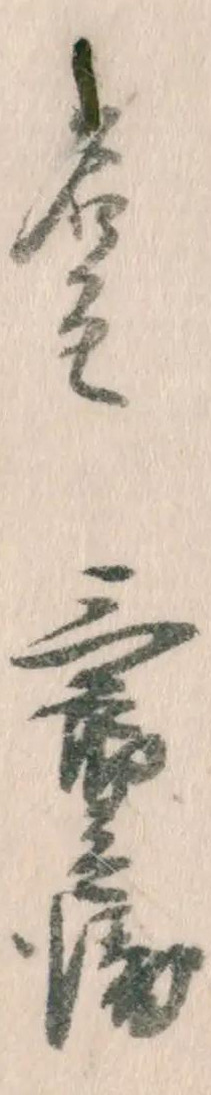名主三郎兵衛
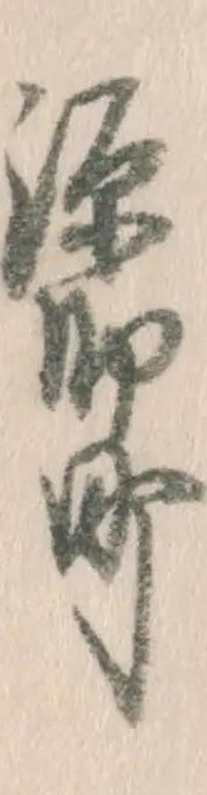源助町
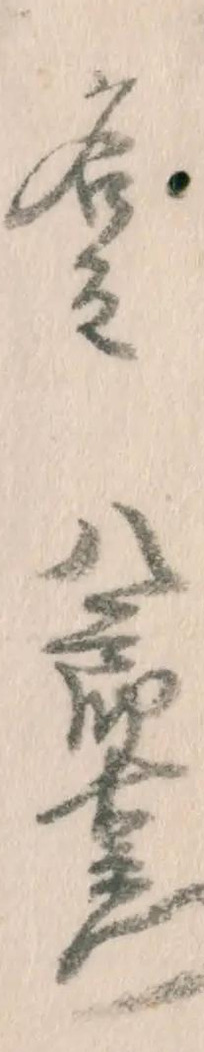名主八郎右衛門

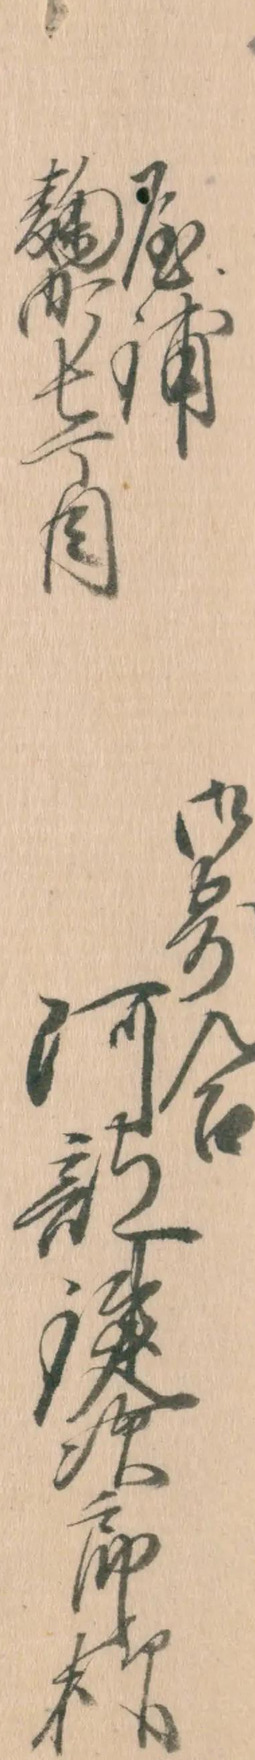麹町七丁目阿部鍵次郎様
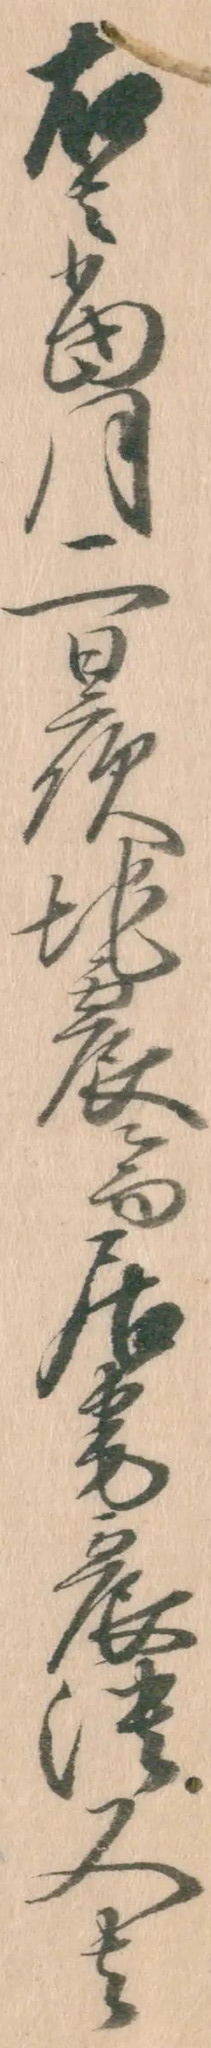右は当月二日夜地震ニ而居宅震潰又は
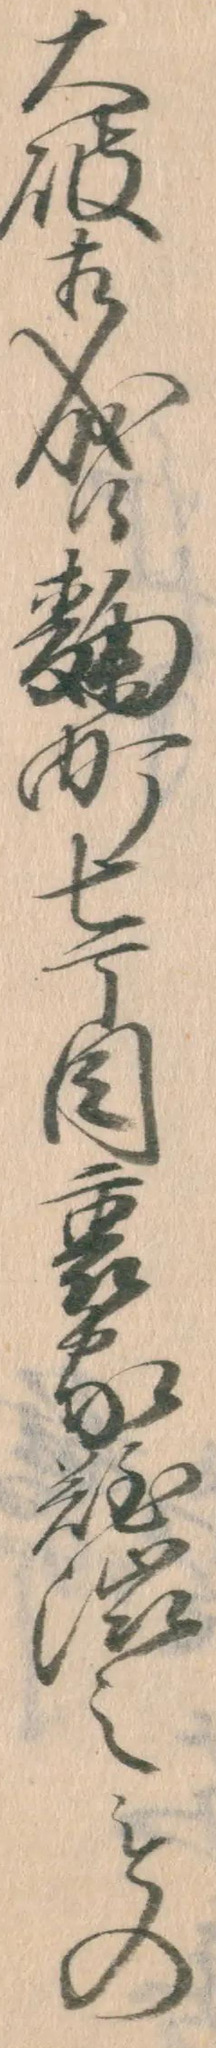大破相成候麹町七丁目裏家難渋之もの
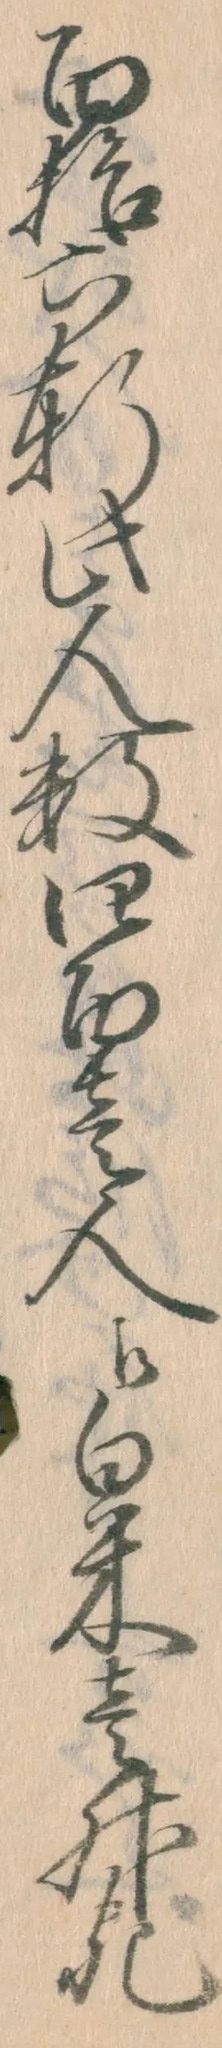百拾六軒此人数四百壱人え白米壱升宛
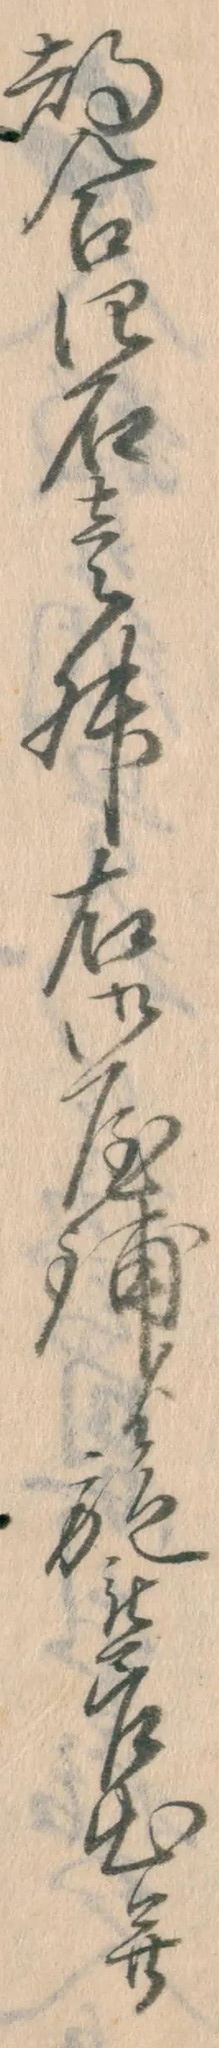都合四石壱升右御屋鋪ゟ施被差出并

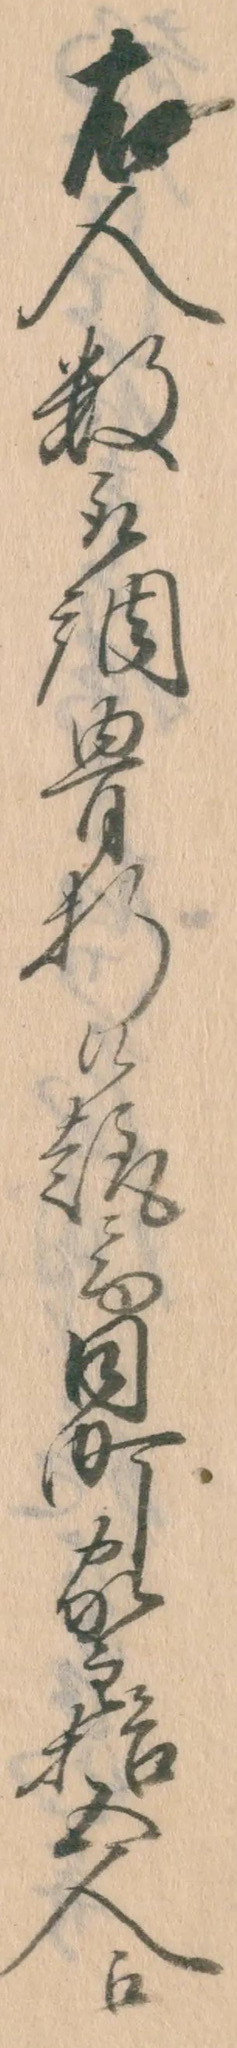右人数取調骨折候趣ニ而同町家主拾五人え
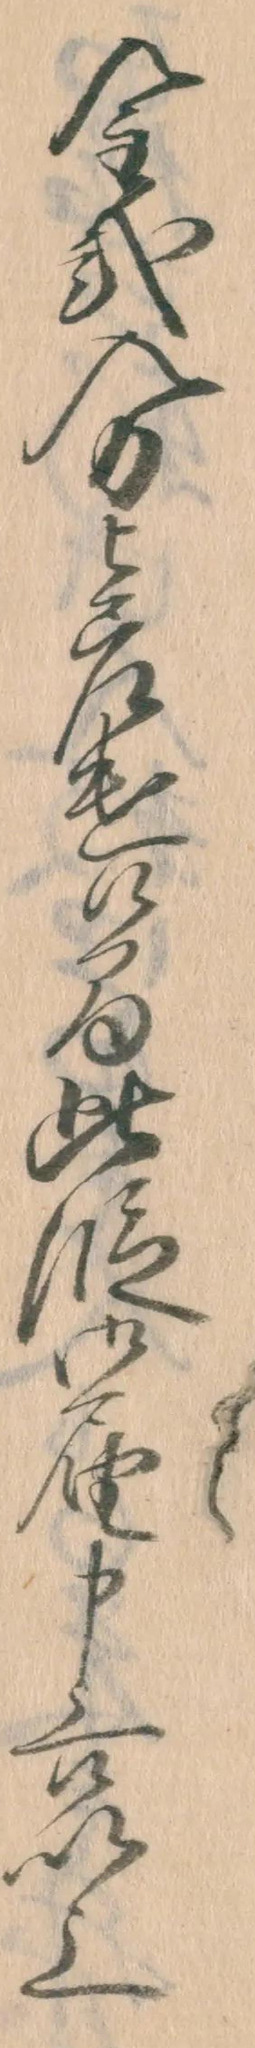金弐分被差遣候間此段御届申上候以上
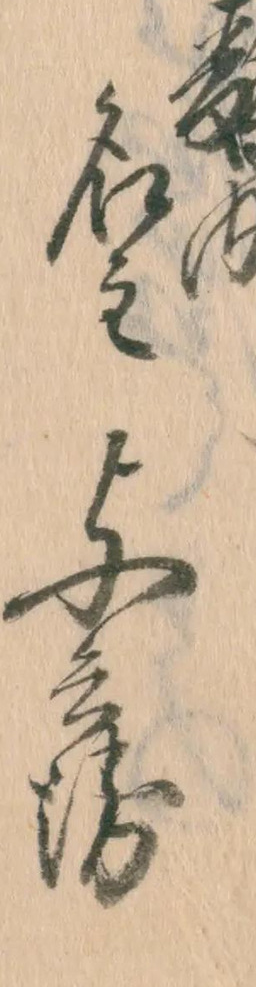名主与兵衛

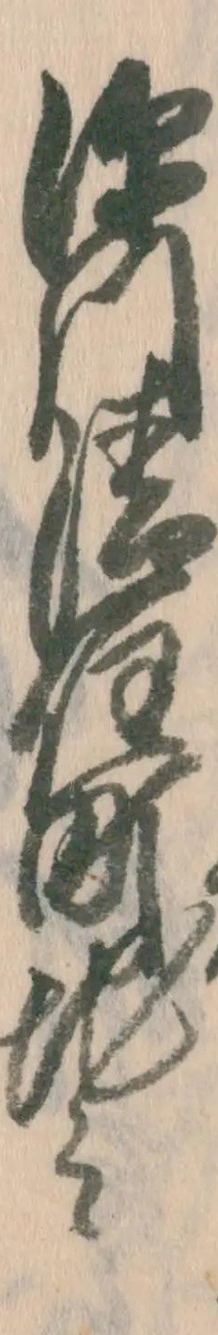深川清住町地主
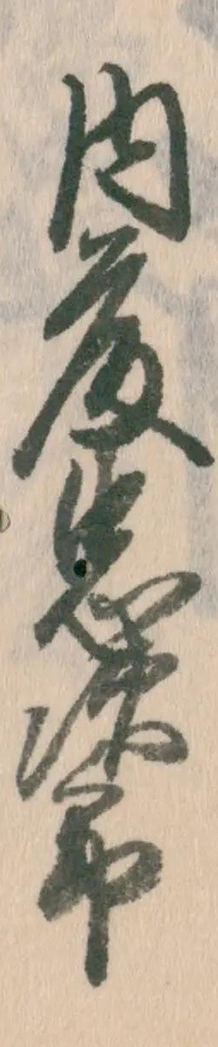内藤忠次郎
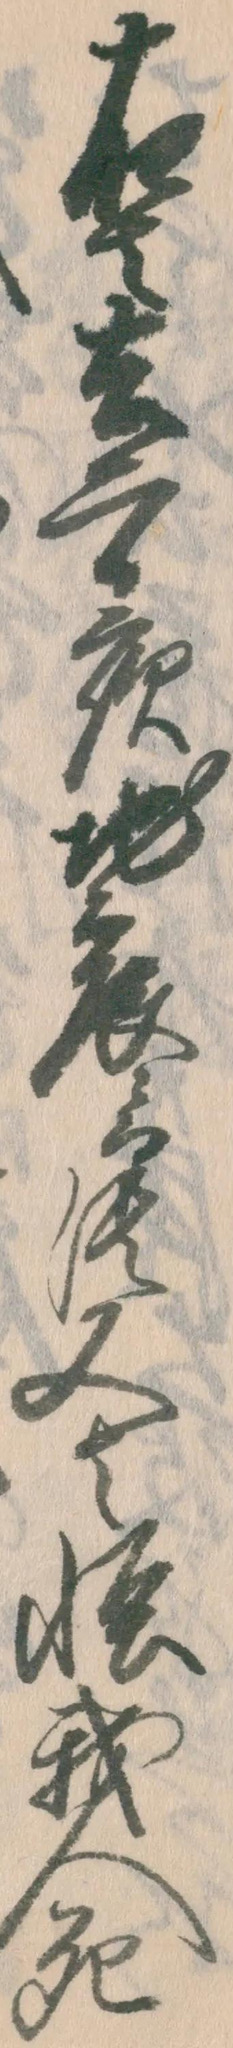右は去二日夜地震ニ而潰又は怪我人死
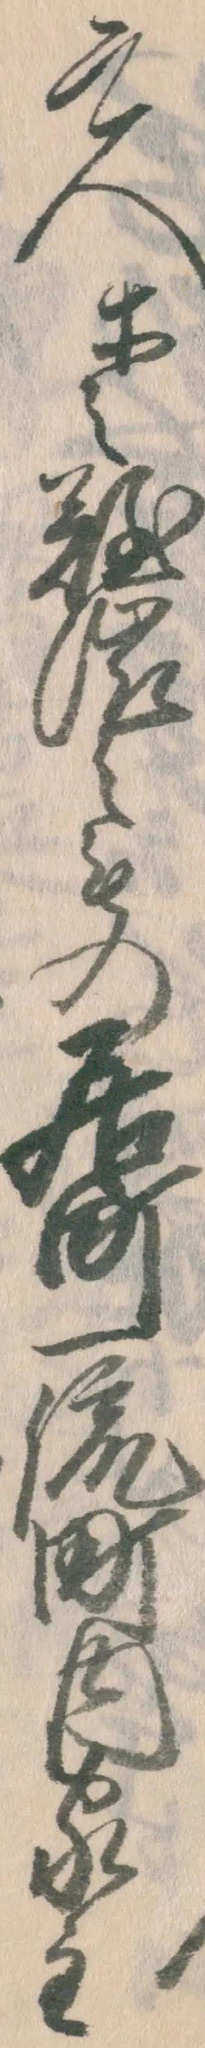亡人等之難渋之もの居町一流町内家主
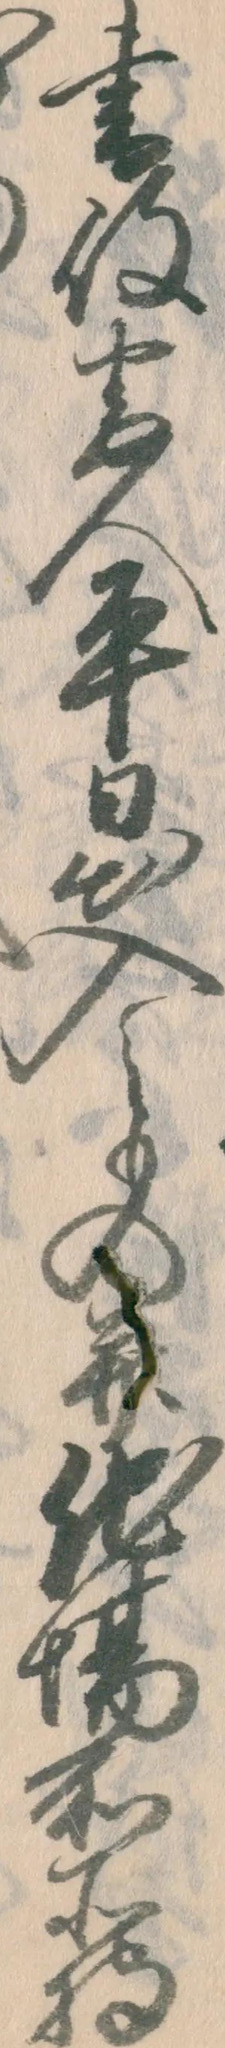書役番人平日出入之もの并他場所所持
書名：武家方并寺院等ニテ施差出候一件
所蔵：国立国会図書館 National Diet Library, JAPAN
